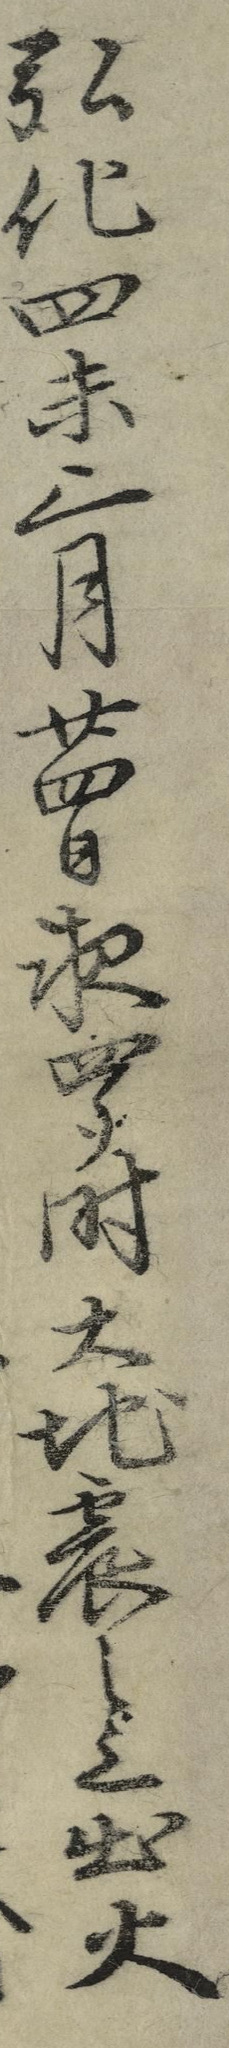弘化四未三月廿四日夜四ッ時大地震之上出火
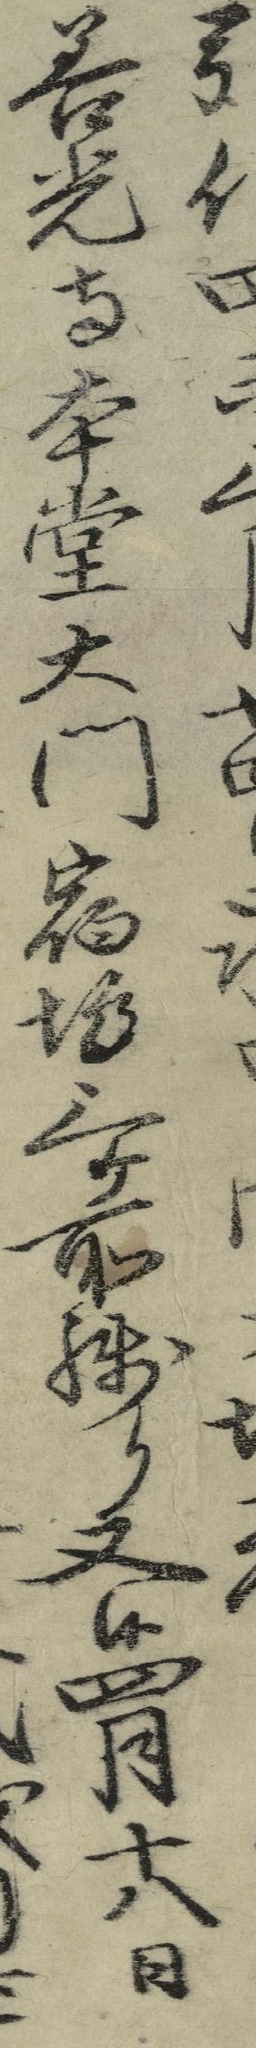善光寺本堂大門宿坊三ヶ所残り又候四月十八日
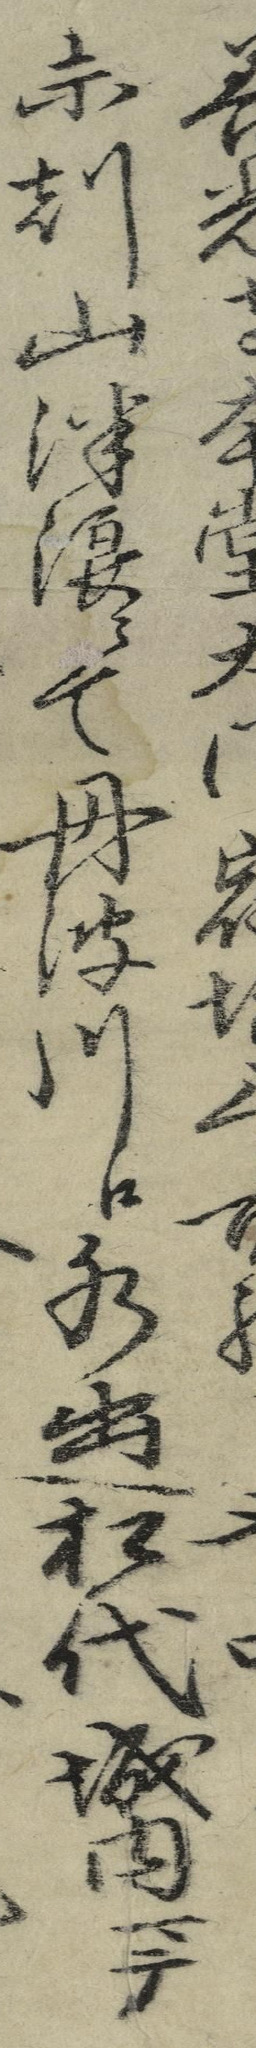未刻山津波二て丹波川江水出松代城内マテ
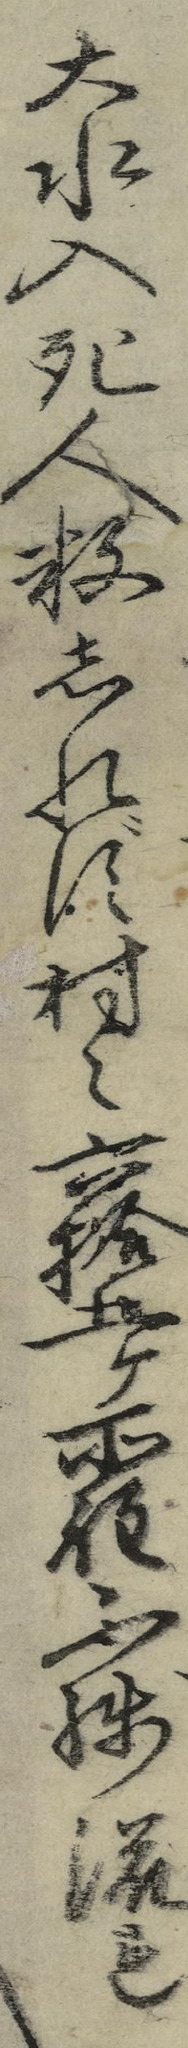大水入死人数しれず村々六拾五ヶ所程不残流れ
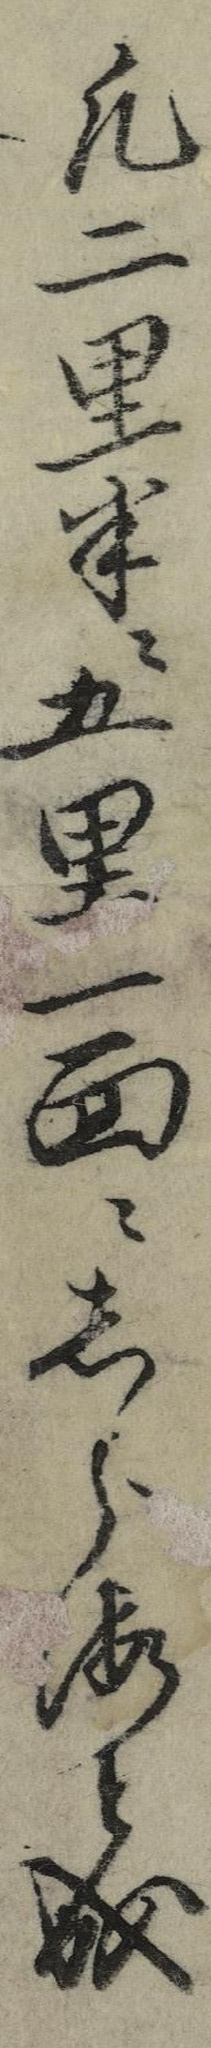凡二里半二五里一面にしら海と成
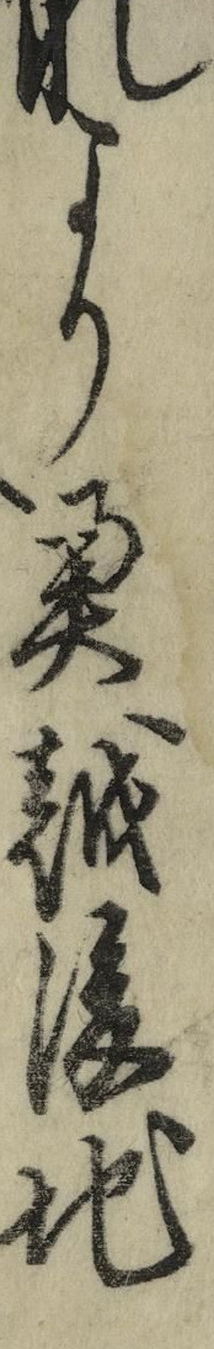これより奥越後地
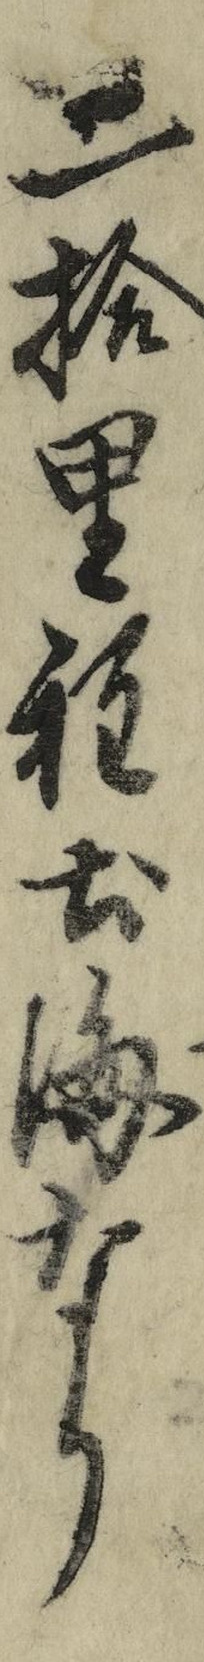二拾里程土海なり
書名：[善光寺地震に関する瓦版]
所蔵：東京大学地震研究所図書室 Earthquake Research Institute Library, The University of Tokyo, JAPAN
